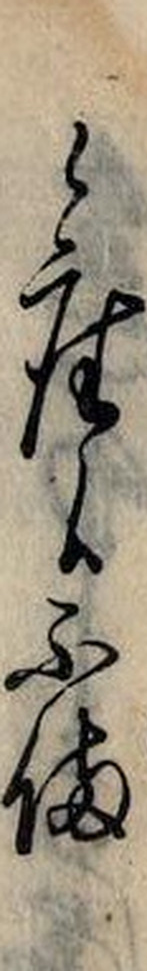御座候不備
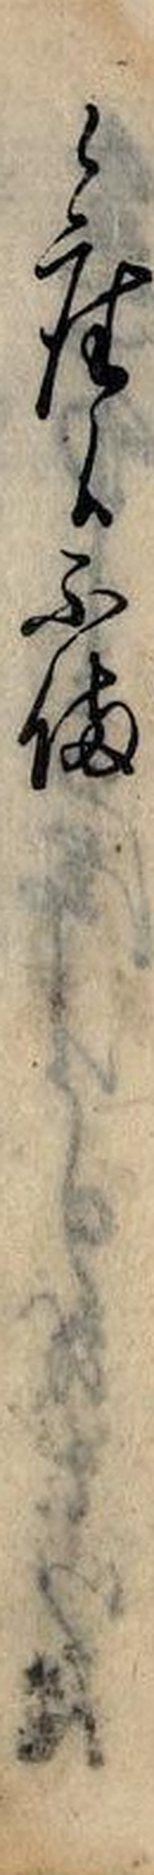御座候不備
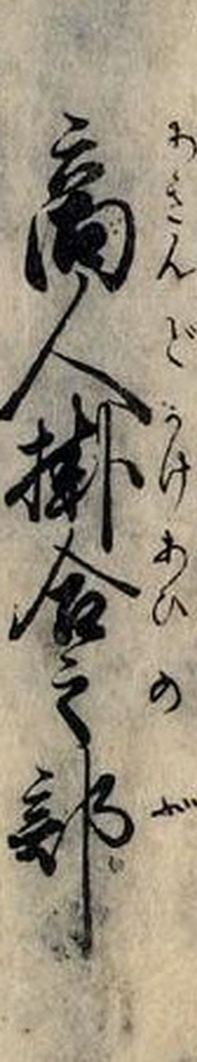商人掛合之部
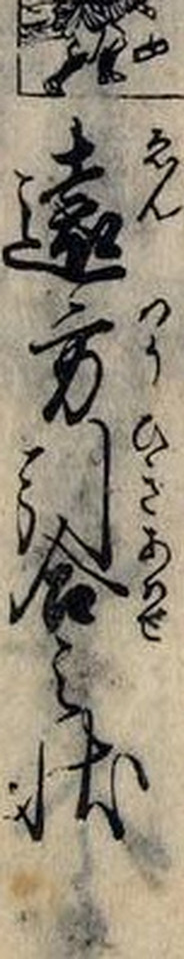遠方引合之状

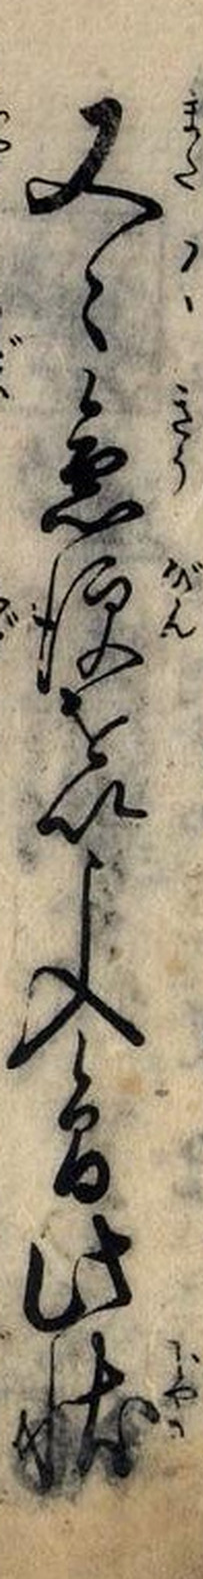又々急便を以申入候間此状
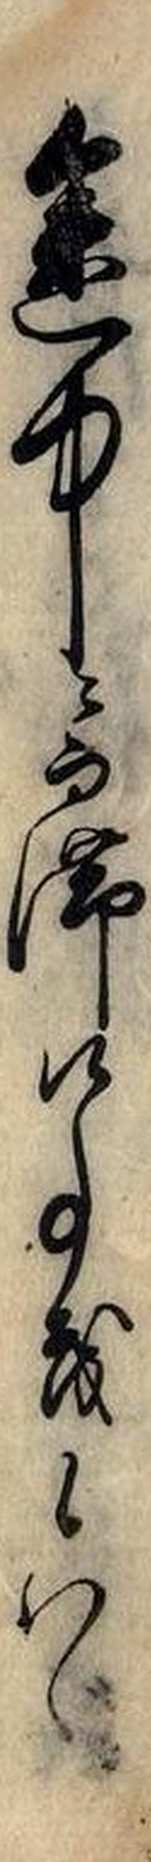途中に而滞候事も候はゞ
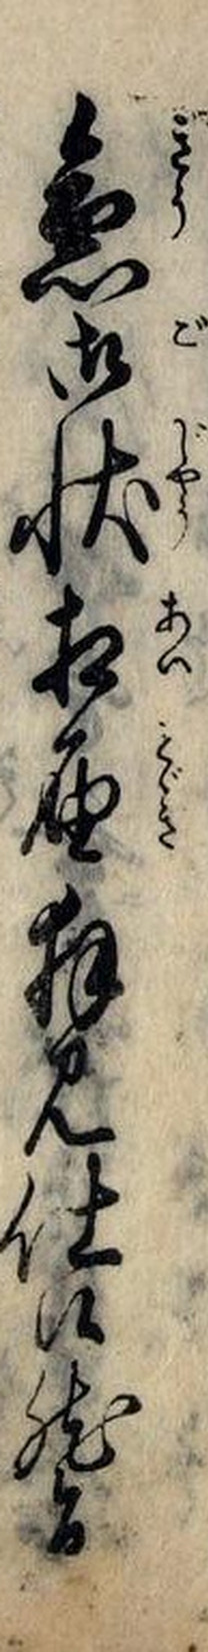急御状相届拝見仕候然者
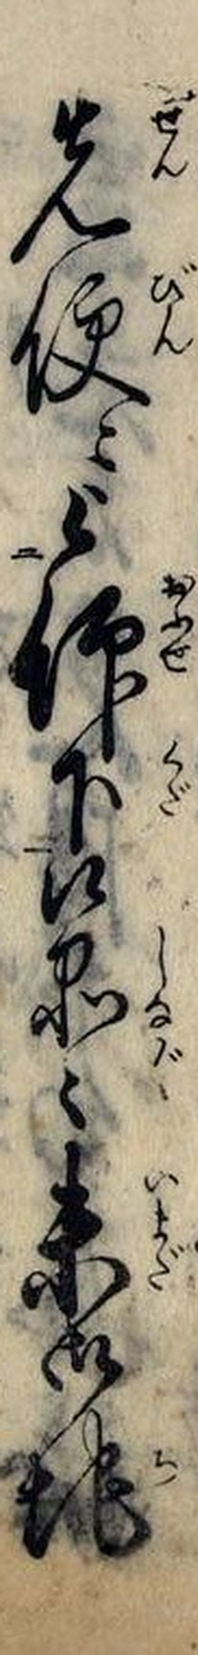先便に被仰下候品々未御地

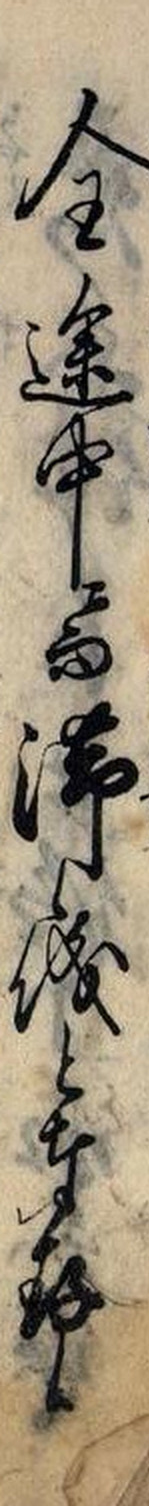全途中に而滞候儀と奉存候
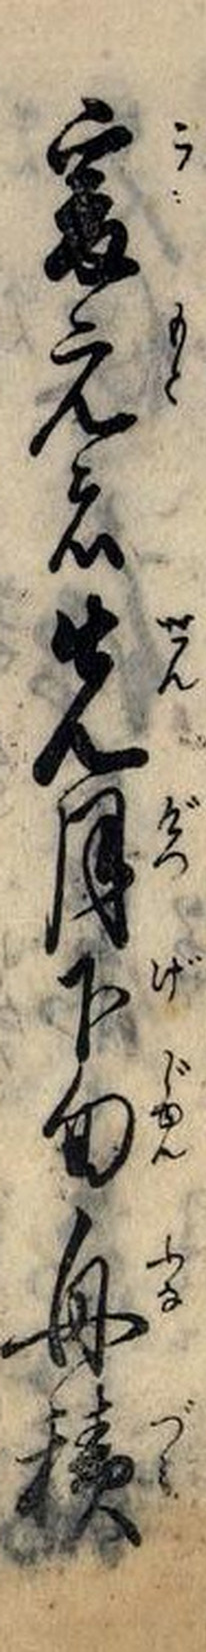爰元者先月下旬舟積
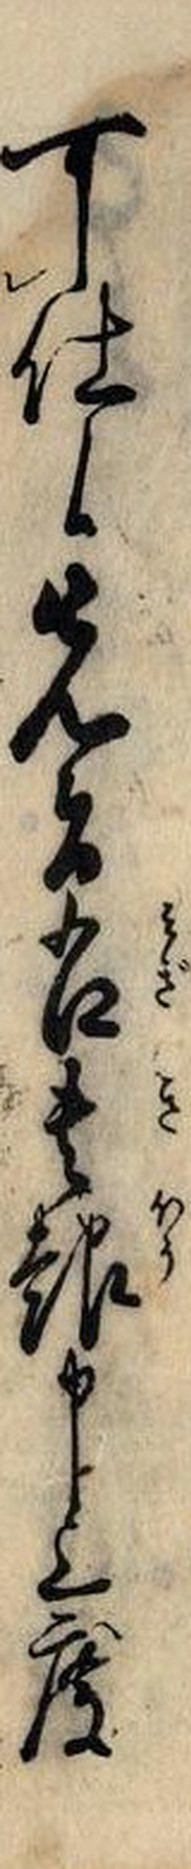可仕候先者右貴報申上度
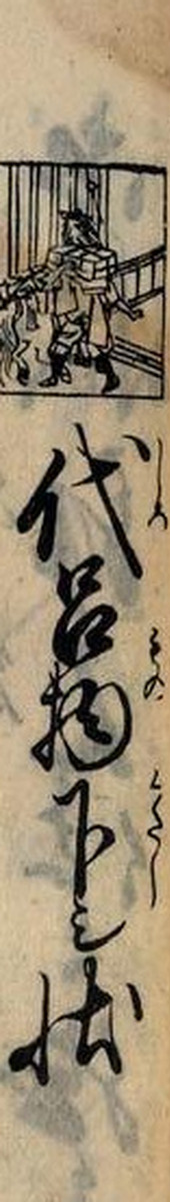代呂物下シ状
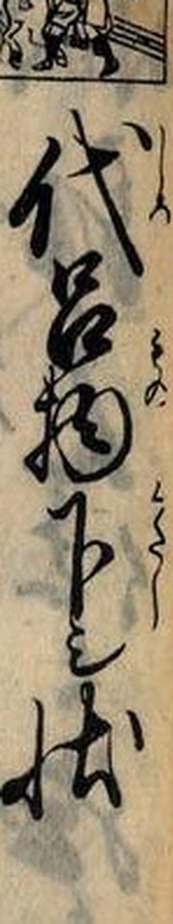代呂物下シ状
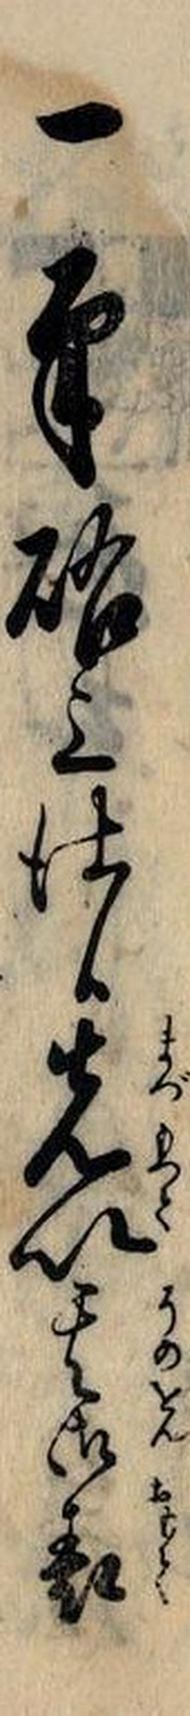一筆啓上仕候先以其御表
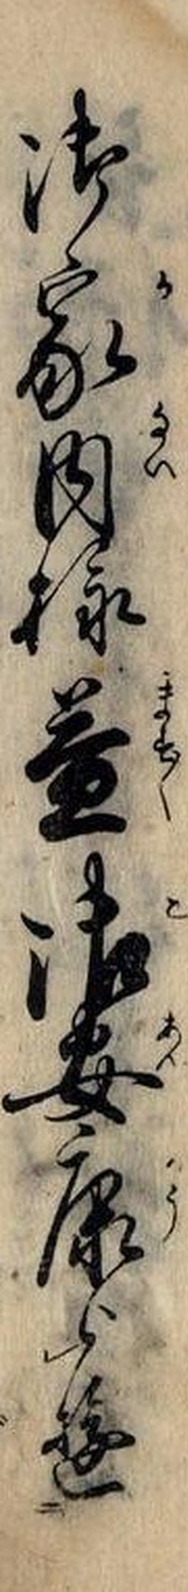御家内様益御安康被遊
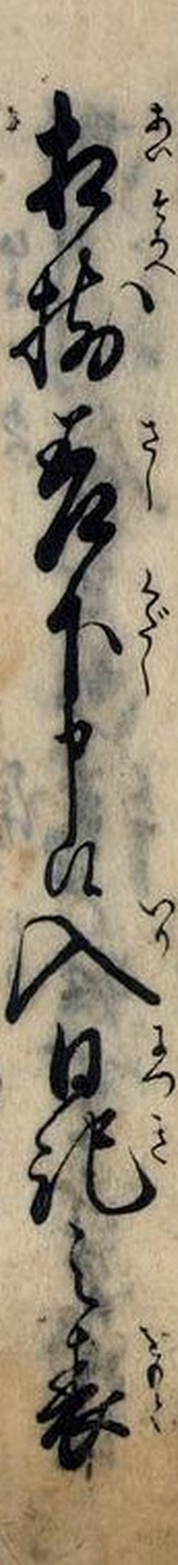相揃差下申候入日記之表
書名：大成用文章（往来物）
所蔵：福井県文書館 Fukui Prefectural Archives
